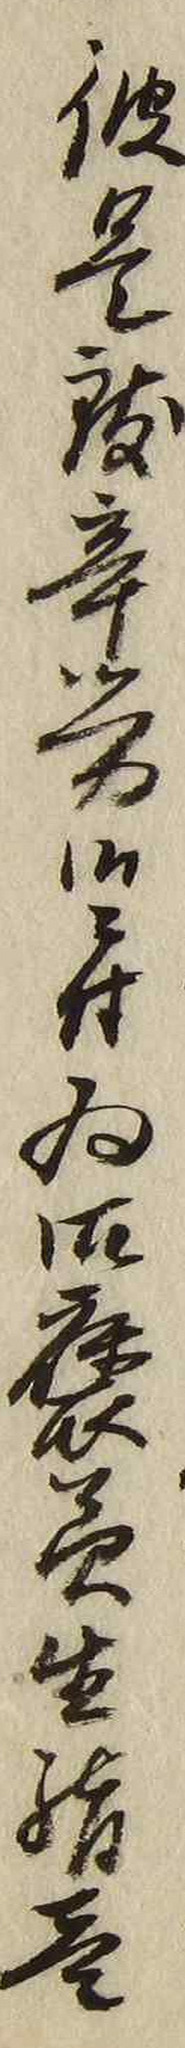彼是致辛労候ニ付為御褒美生絹壱

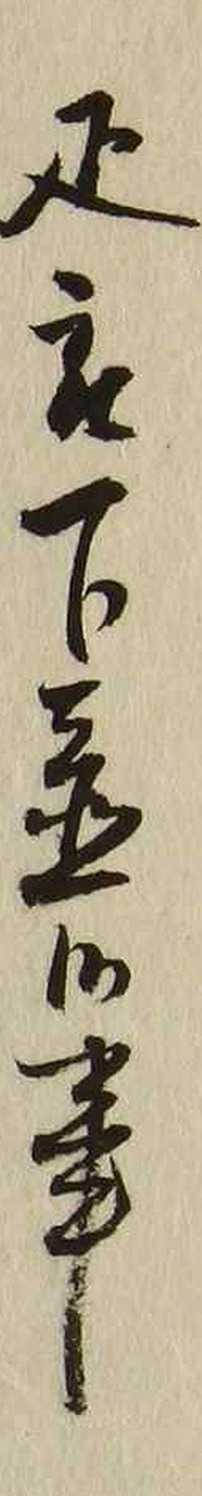疋被下置候事
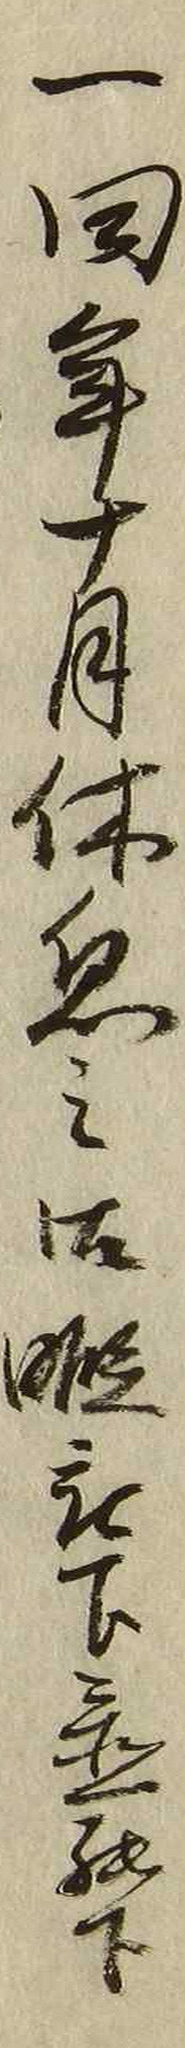一同年十月休息之御暇被下置罷下
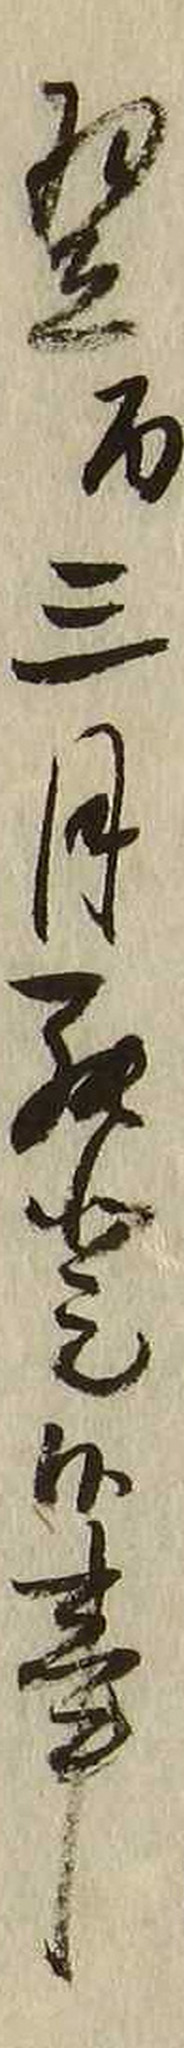翌酉三月罷登候事
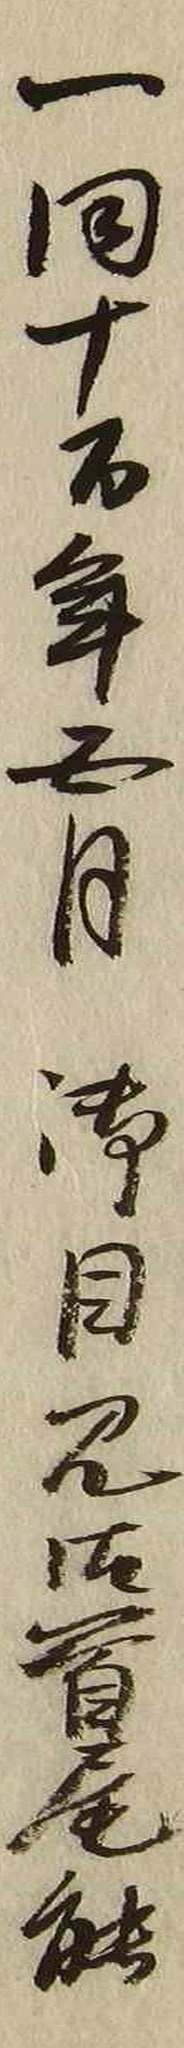一同十酉年五月御目見御首尾能
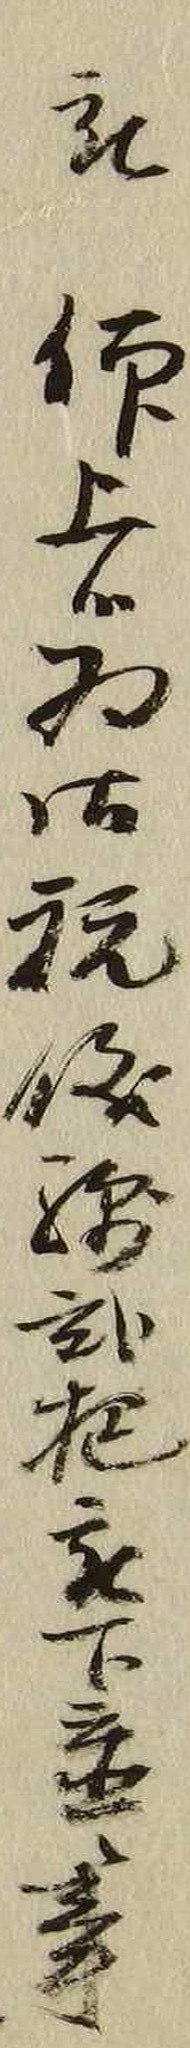被仰上候為御祝儀綿弐把被下置候事
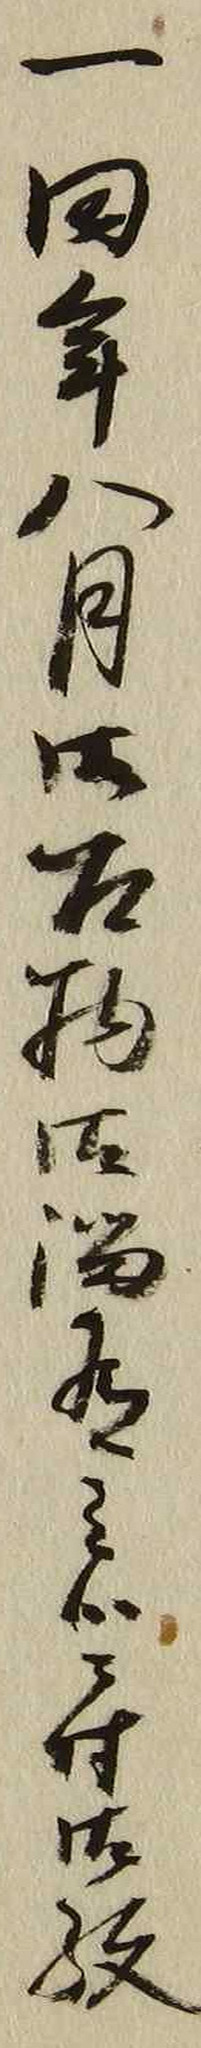一同年八月御召物御溜有之候ニ付御紋
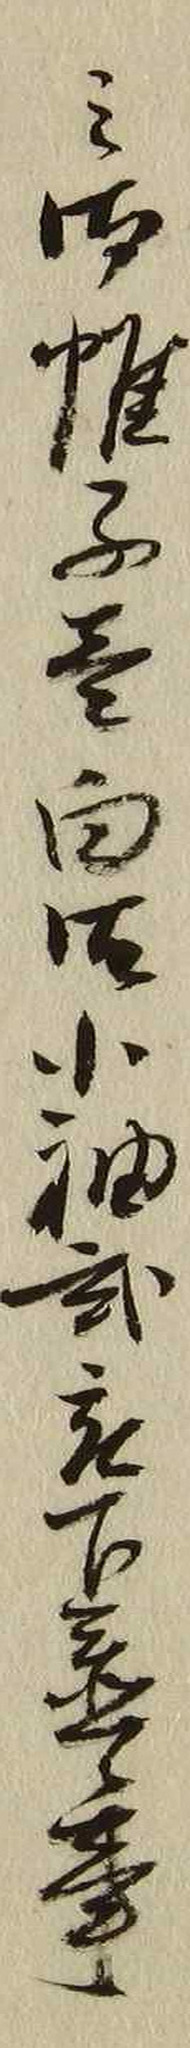之御帷子壱白御小袖弐被下置候事
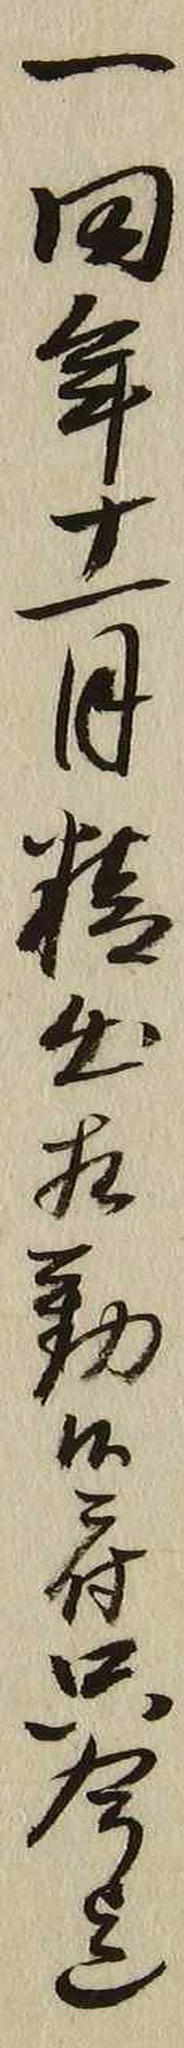一同年十一月精出相勤候ニ付只今迄
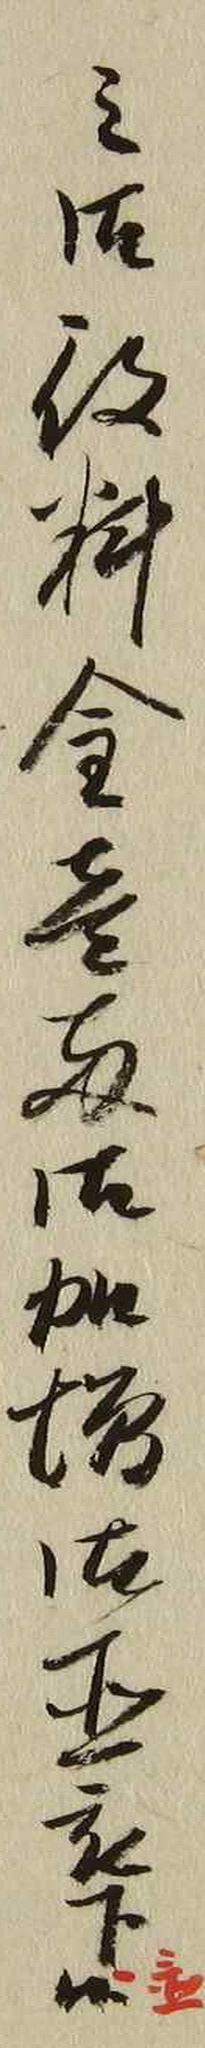之御役料金壱両御加増御直被下置候
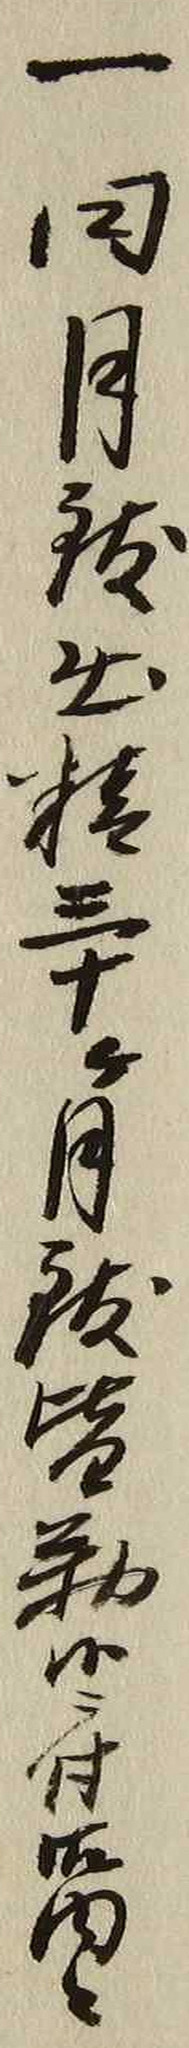一同月致出精三十ケ月致皆勤候ニ付御内々
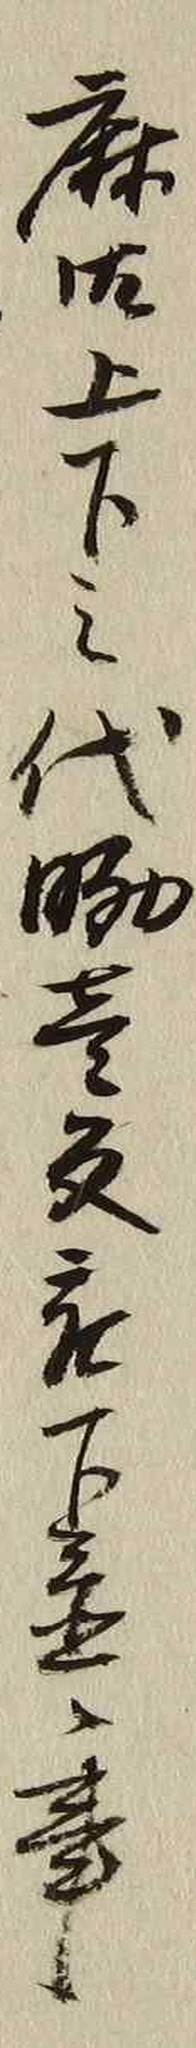麻御上下之代晒晦壱反被下置候事
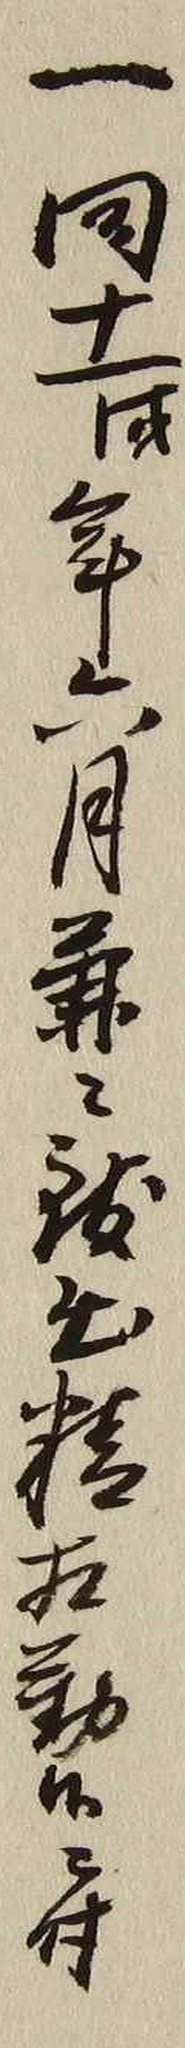一同十一戌年六月兼々致出精相勤候ニ付
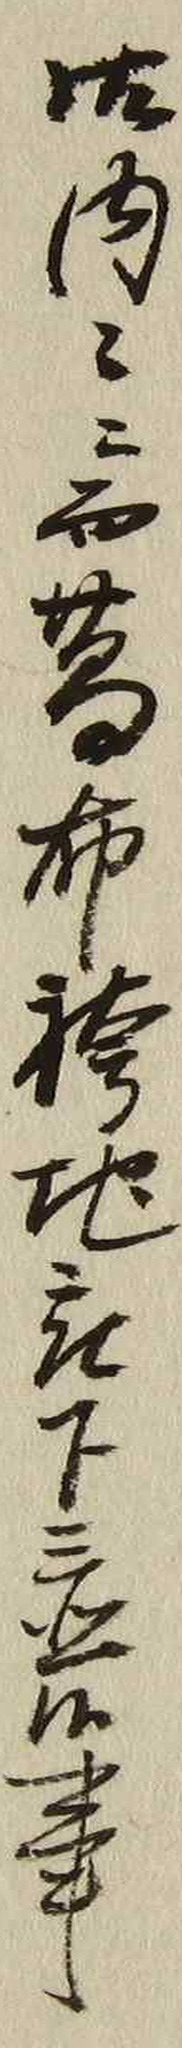御内々ニ而葛布袴地被下置候事
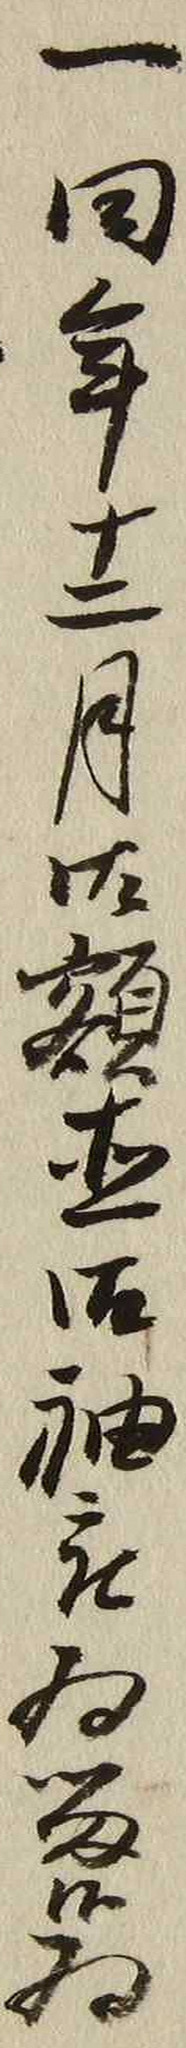一同年十二月御額直御袖被為留候為
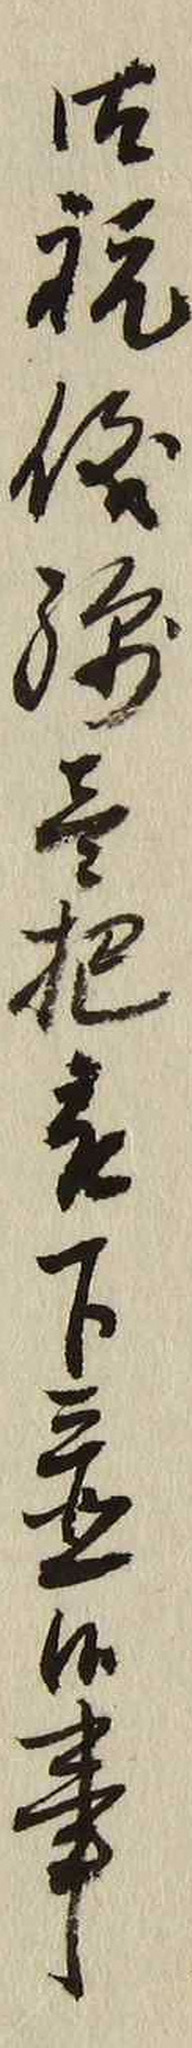御祝儀綿壱把被下置候事
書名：諸士系譜　巻之356　す之部6
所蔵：会津若松市立会津図書館
